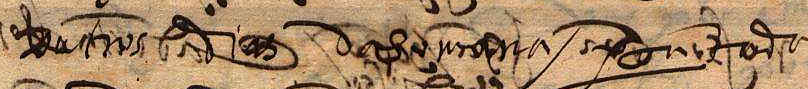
dictos dias da somana / ꝑgūtada
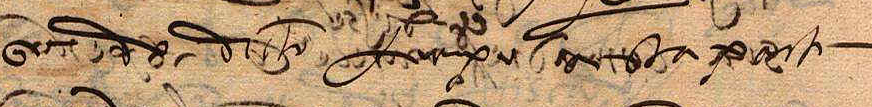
se do dicto tempo a esta parte
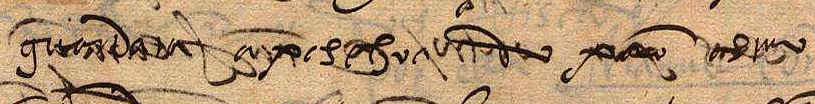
guardava a paschoa do pão asmo
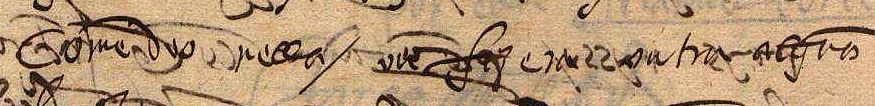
comēdoo nella / ou fezera outra algūa
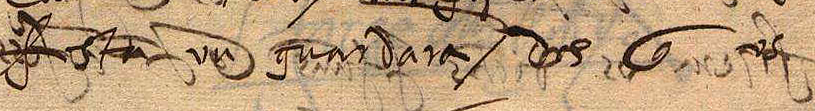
festa ou guardara / dos q̄ os
